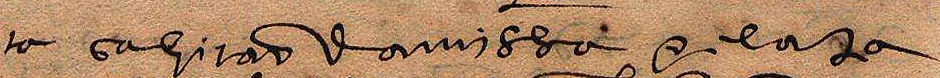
ta sahirão da mjssa e ela ta
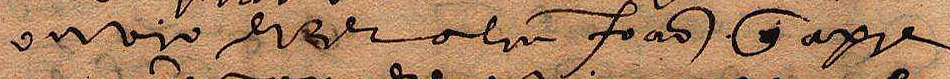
ouvio dizer a hū Joaõ q̄ a pre
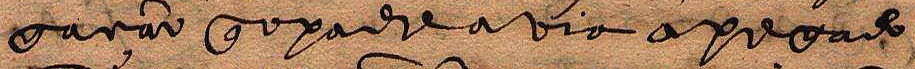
gação q̄ o padre avia apregado
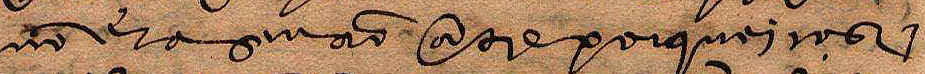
nō era senão ātre porquejros
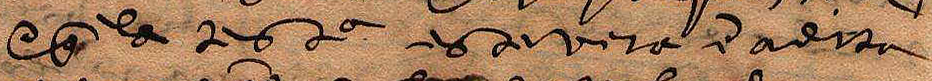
e q̄ ela testa estevera ē a dita
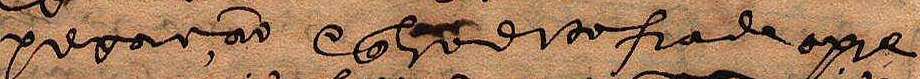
pregação e q̄ ho dito frade a pre
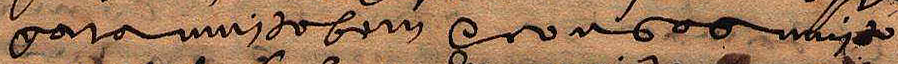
gara mujto bem e cousas mujto
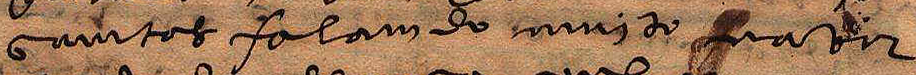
samtas falamdo mujto na vir
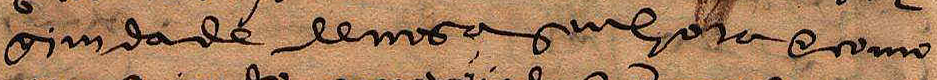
gimdade de nosa senhora e como
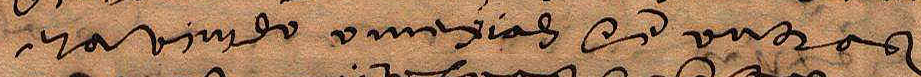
era vimdo o mexias e ē outras
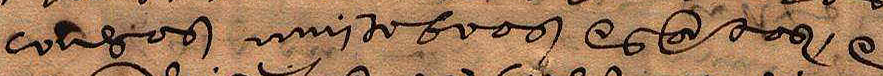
cousas mujto boas e sātas / e
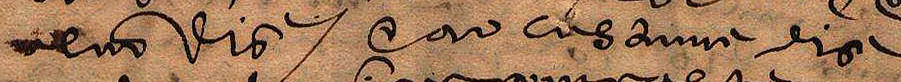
al nō dise / e ao custume dise
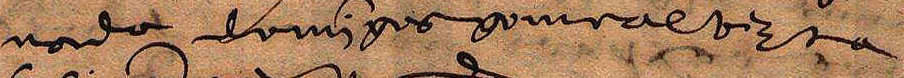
nada domj̄gos gomcalvez ta
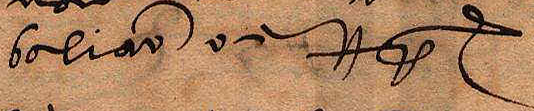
baliaõ / o estp̄j
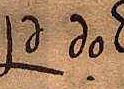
Ld. do
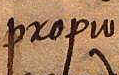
propio
